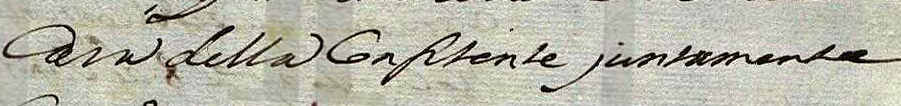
Caza della Confitente juntamente
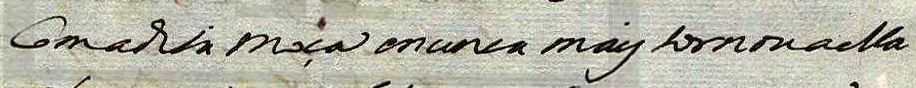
Com a dita moça e nunca mais tornou a ella
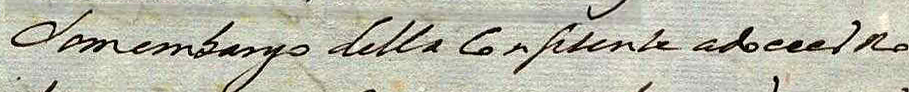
Sem embargo della Confitente adoecer no
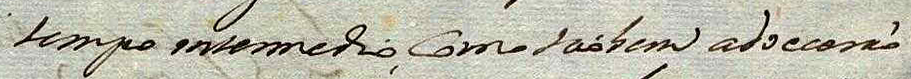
tempo intermedio, como taõbem adoeceraõ
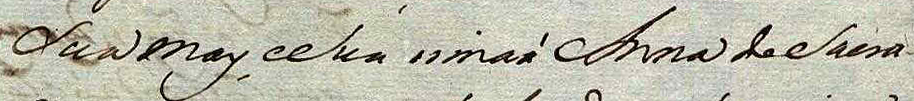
Sua may, e Sua irmaã Anna de Sacra
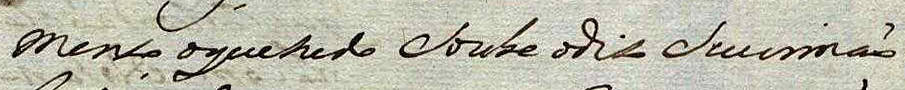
mento, o que tudo soube o dito seu irmaõ
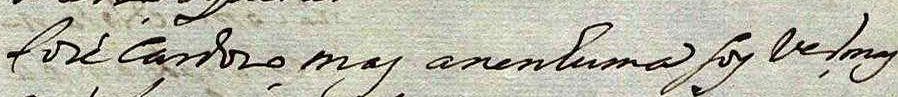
Iozé cardozo, mas a nenhuma foy Ver, mas
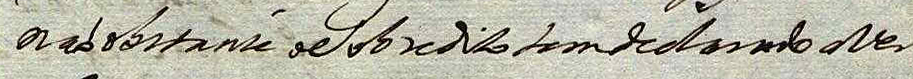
naõ obstante o sobredito tem declarado a ver
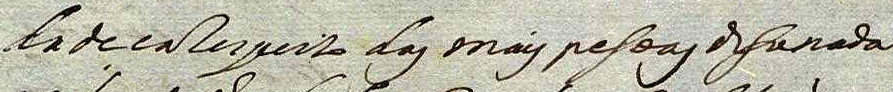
dade e a Respeito das mais pesoas disse nada
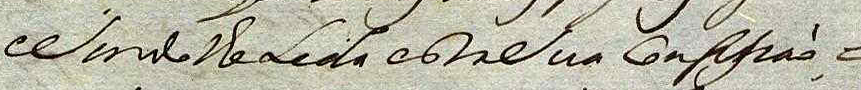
e Sendolhe Lida esta Sua confissaõ, e
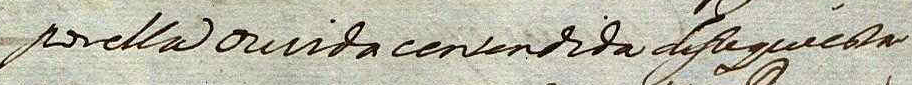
por ella ouvida e entendida disse que esta
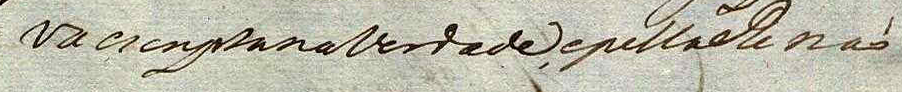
va escripta na Verdade, e pella Re naõ
